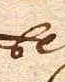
te
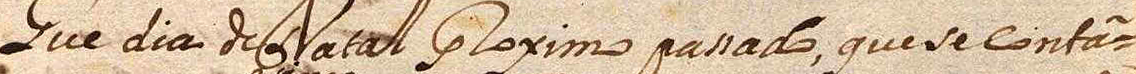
Que dia de Natal proximo passado, que se conta
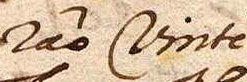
raõ vinte
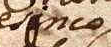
e sinco
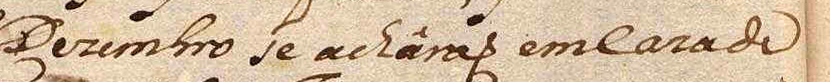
de Dezembro se achâraõ em caza de
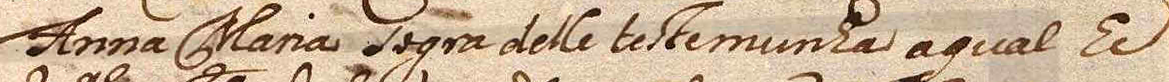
Anna Maria sogra delle testemunha a qual he
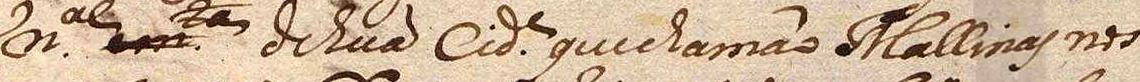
n.al _ de huā Cid.e que chamão Mallinas nos
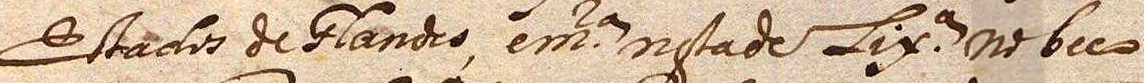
Estados de Flandes, e m.ra nesta de Lix.a no beco
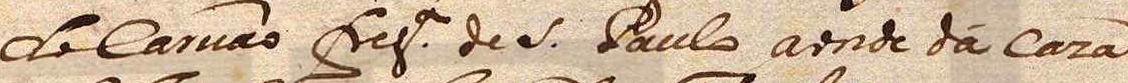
do Caruão freg.a de S. Paulo aonde dá caza
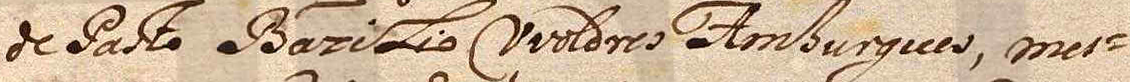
de Pasto Bazilio Vvoldres Amburgues, mes
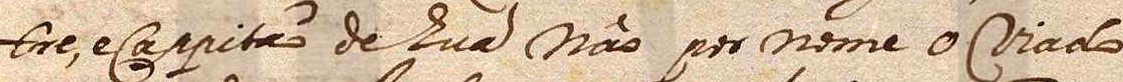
tre, e Cappitaõ de huā nâo por nome o Viado
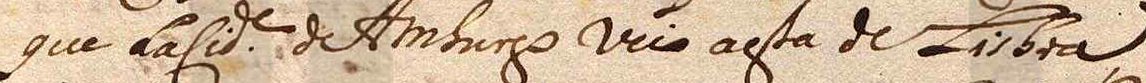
que da Cid.e de Amburgo veio a esta de Lisboa,
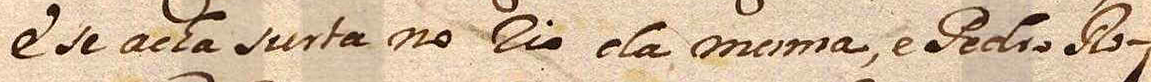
e se acha surta no Rio da mesma, e Pedro Ro
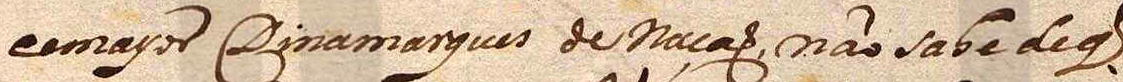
camayor Dinamarques de naçaõ, não sabe de q̄
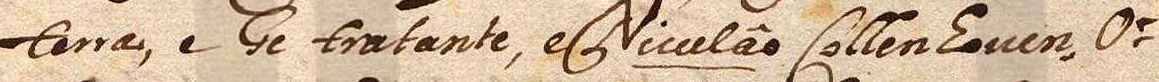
terra, e he tratante, e Niculâo Collenhouen, O
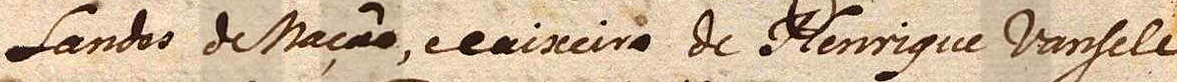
landes de nação, e caixeiro de Henrique Vansele
